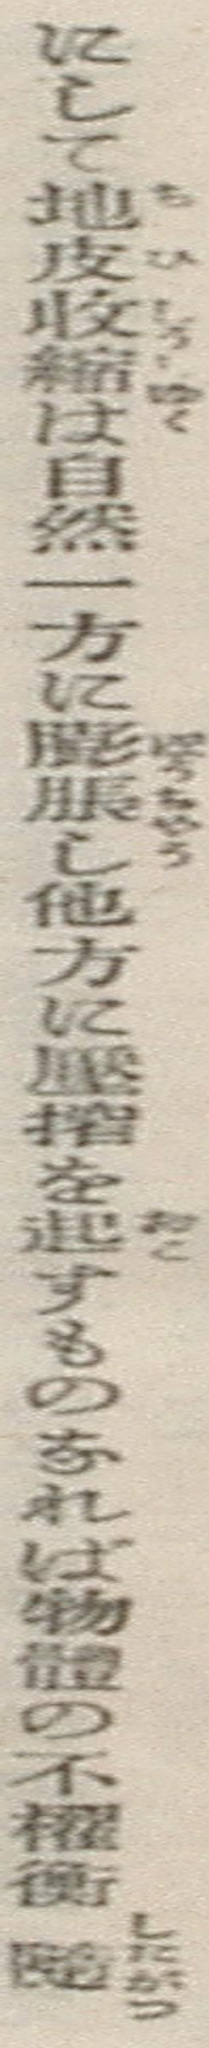にして地皮収縮は自然一方に膨脹し他方に圧搾を起すものなれば物体の不権衡随したがつ
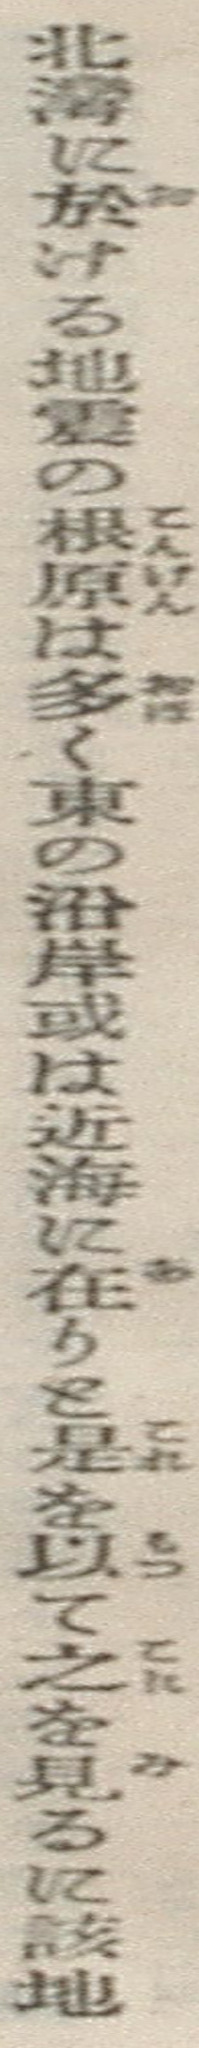北湾に於ける地震の根原は多く東の沿岸或は近海に在りと是を以て之を見るに該地
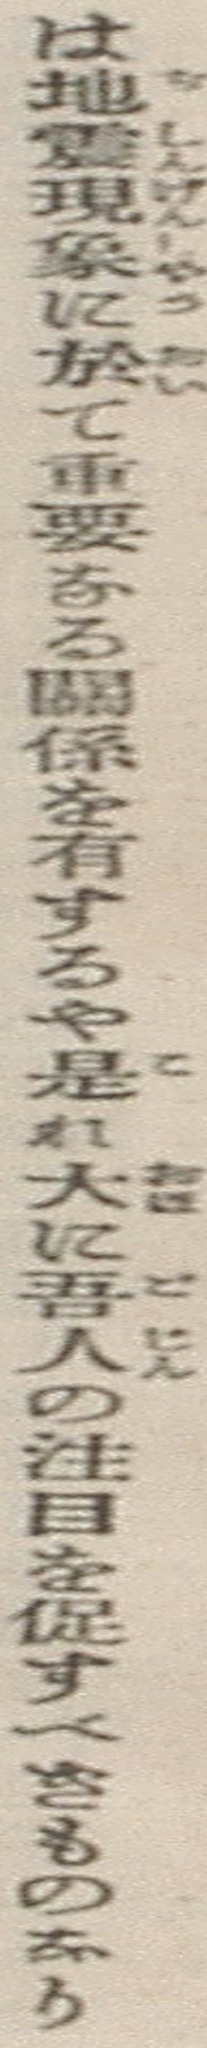は地震現象に於て重要なる関係を有するや是れ大に吾人の注目を促すべきものなり
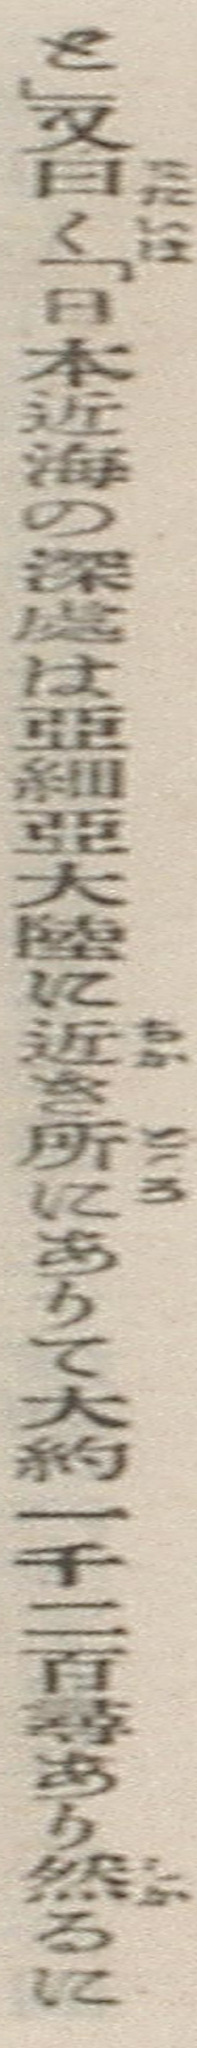と」又曰くまたいは「日本近海の深処は亜細亜大陸に近き所にありて大約一千二百尋あり然るに
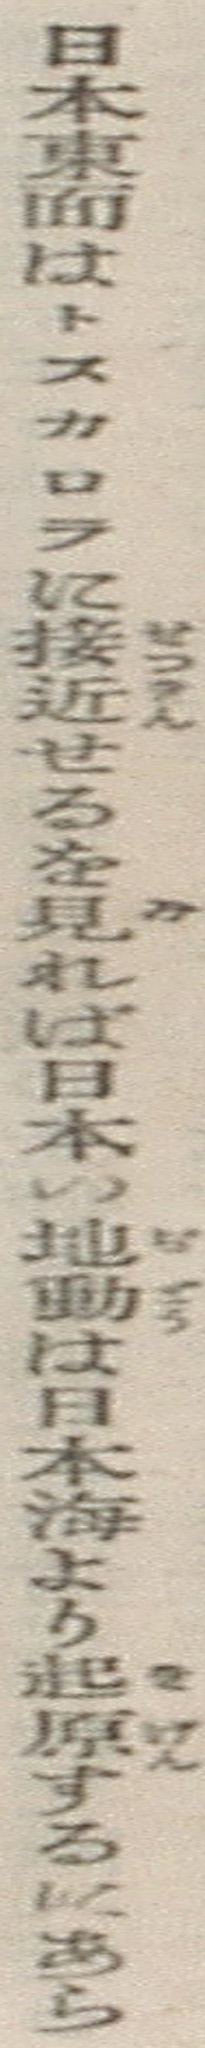日本東面はトクカロラに接近せるを見れば日本の地動は日本海より起原するにあら
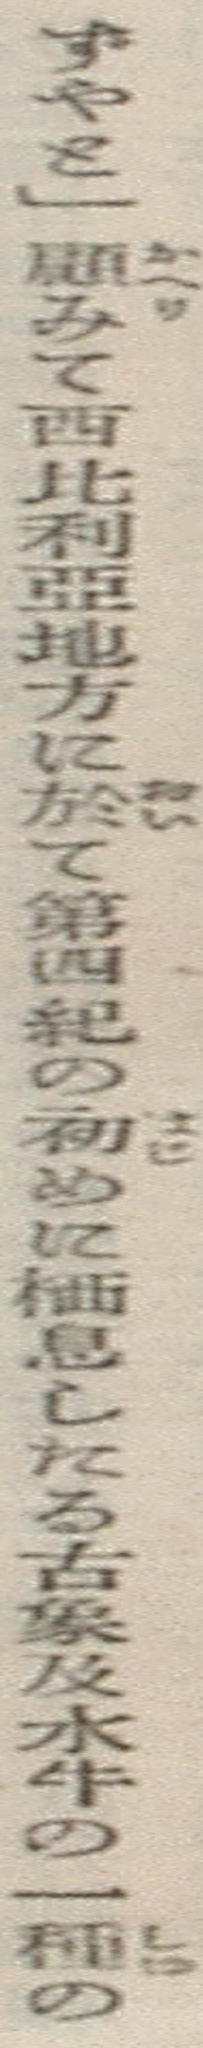ずやと」顧みて西比利亜地方に於て第四紀の初めに栖息したる古象及水牛の一種しゆの
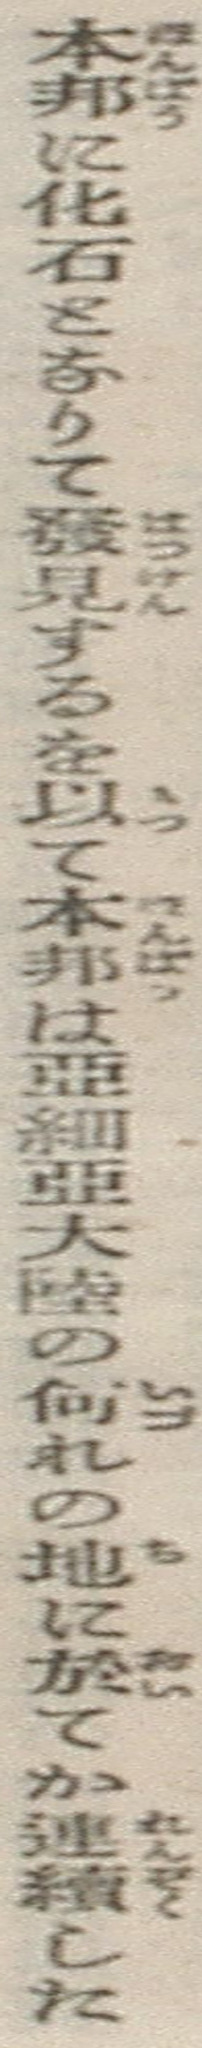本邦に化石となりて発見するを以て本邦は亜細亜大陸の何れの地に於てか連続した
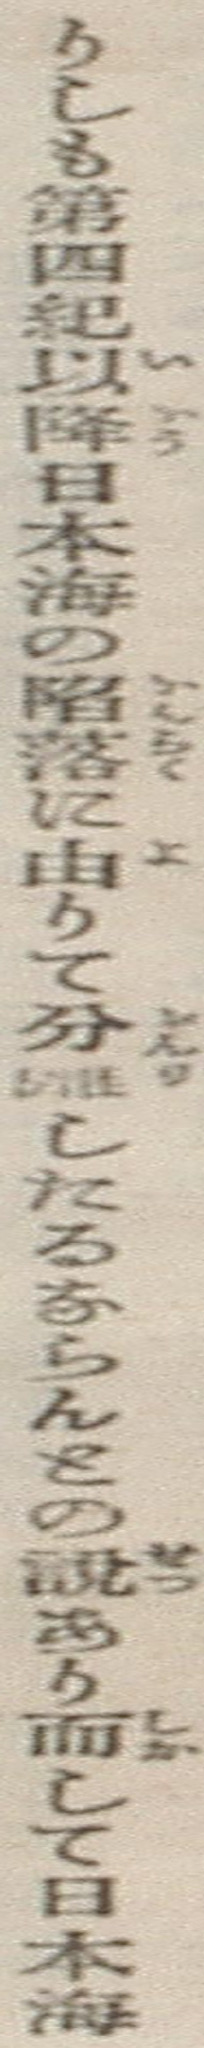りしも第四紀以降いかう日本海の陥落に由りて分離したるならんとの説あり而して日本海
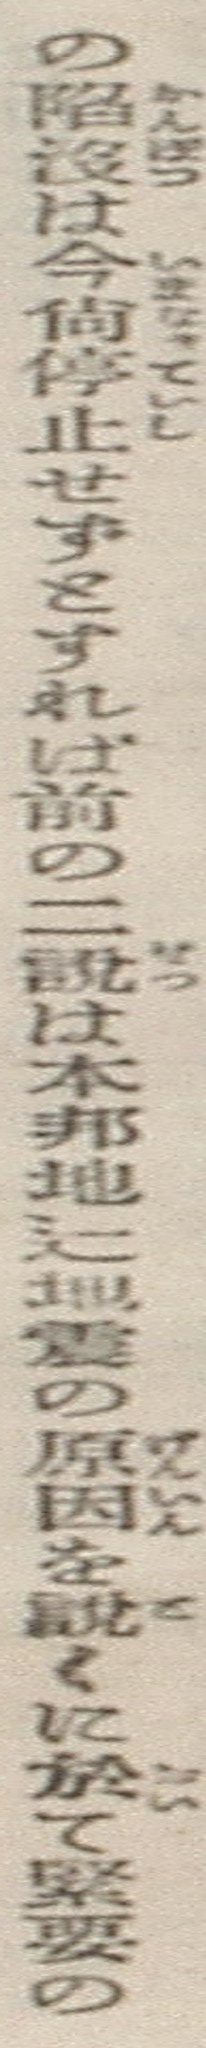の陥没は今尚停止せずとすれば前の二説せつは本邦地辷地震の原因を説くに於て緊要の
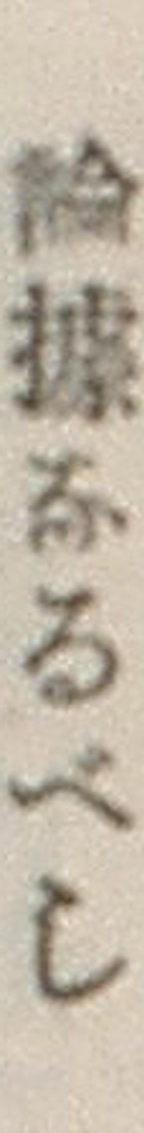論拠なるべし
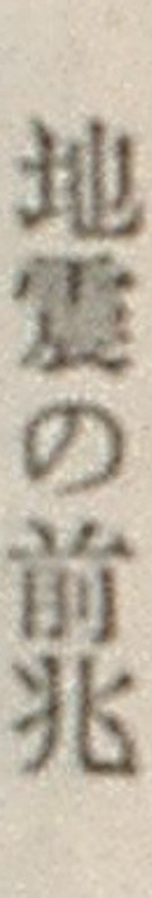地震の前兆
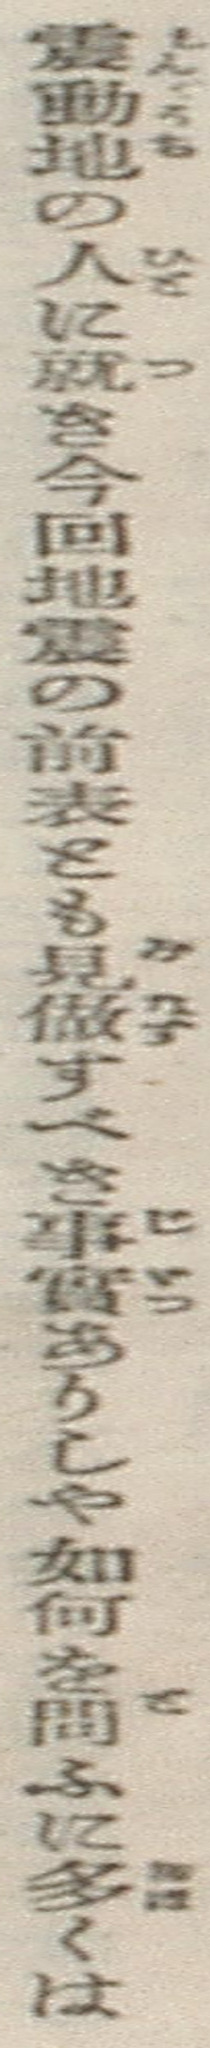震動地の人に就き今回地震の前表とも見做すべき事実ありしや如何を問ふに多くは
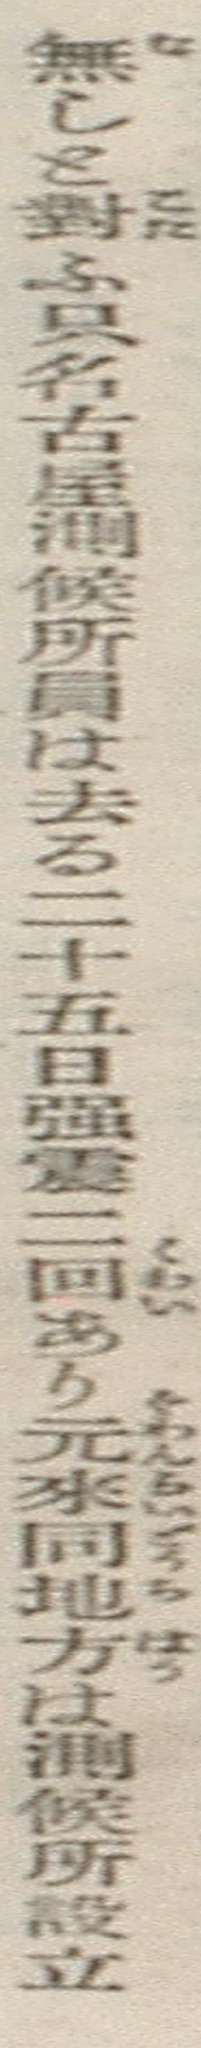無しと対ふ只名古屋測候所員は去る二十五日強震二回くわいあり元来同地方は測候所設立
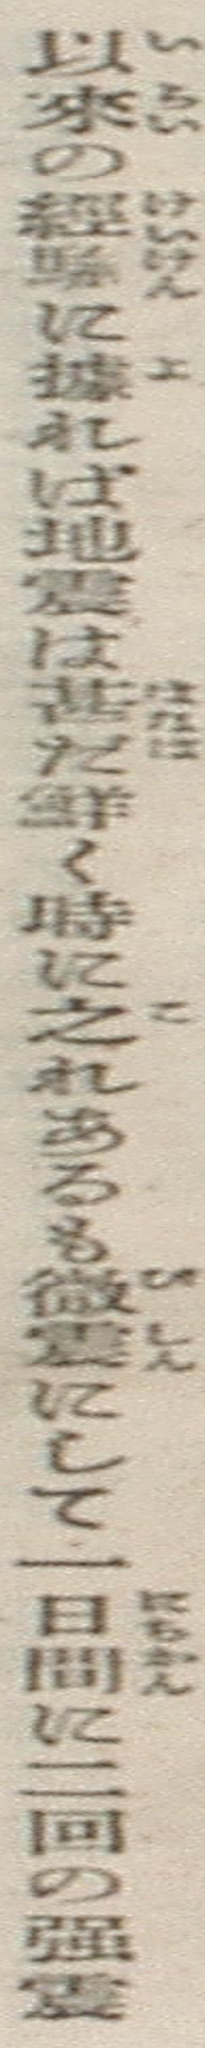以来の経験に拠れば地震は甚だ鮮く時に之れあるも微震にして一日間にちかんに二回の強震
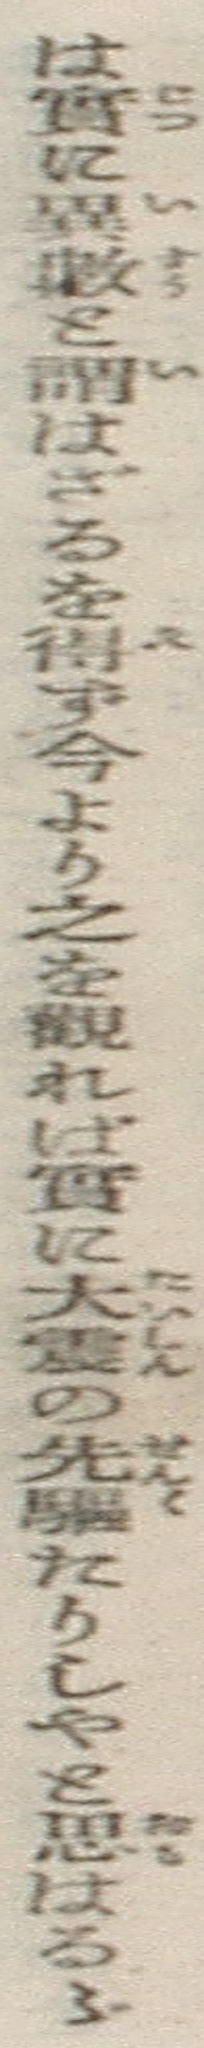は実に異数と謂はざるを得ず今より之を観れば実に大震の先駆たりしやと思はる〻゛
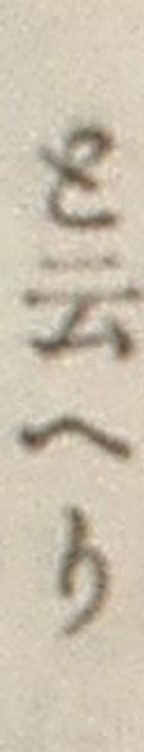と云へり
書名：愛知岐阜福井三県　大地震見聞録（内題）
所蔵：東京大学地震研究所図書室 Earthquake Research Institute Library, The University of Tokyo, JAPAN
